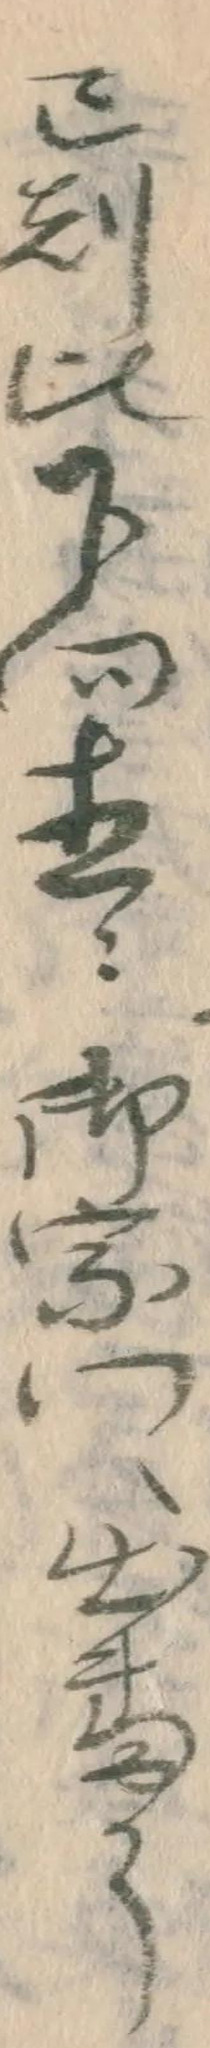巳刻比下向直ニ御家門へ出番之
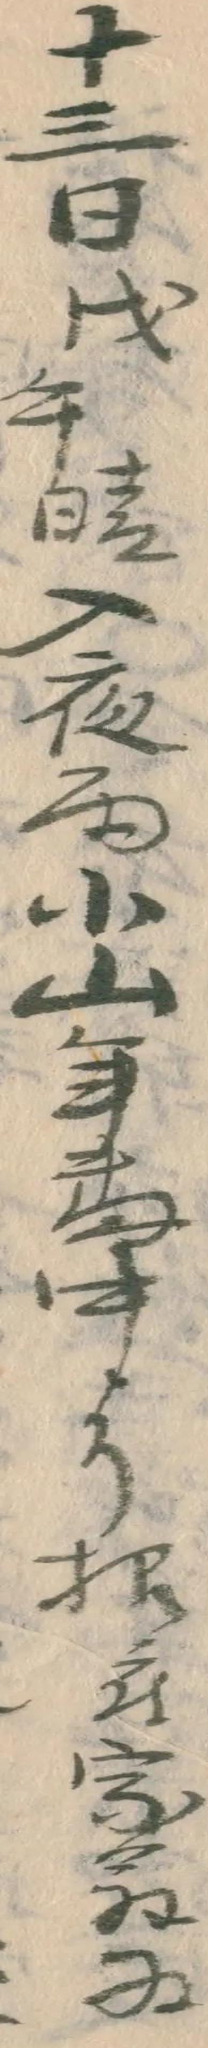十三日戊午晴入夜雨小山年番中より招ニ付家翁為
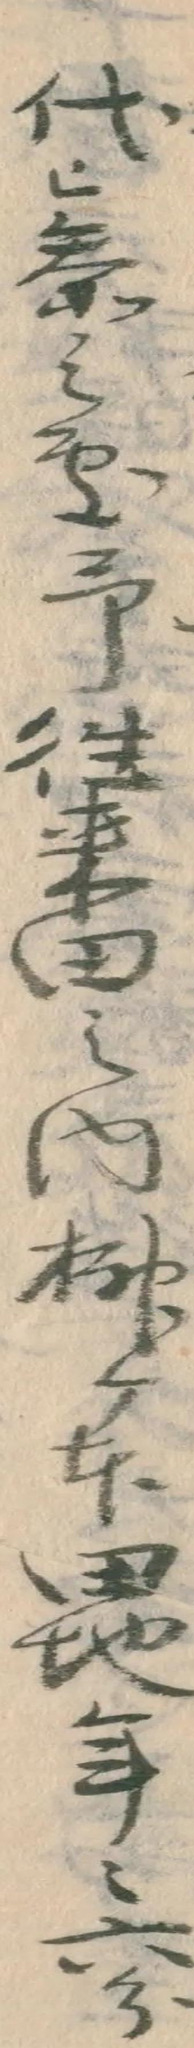代被参之處予往来田之内榊ケ本田地年々六分
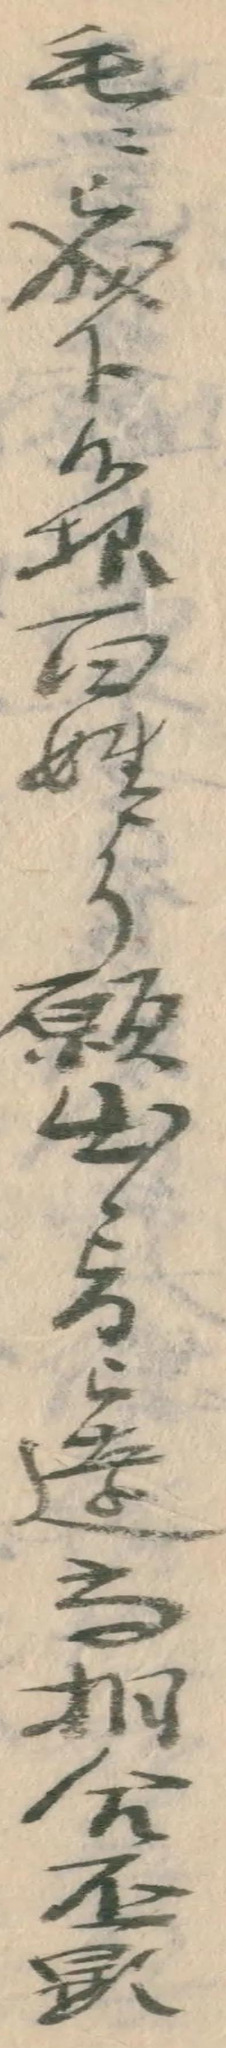毛ニ被成下候様百姓より願出候旨被達両相合丕顕
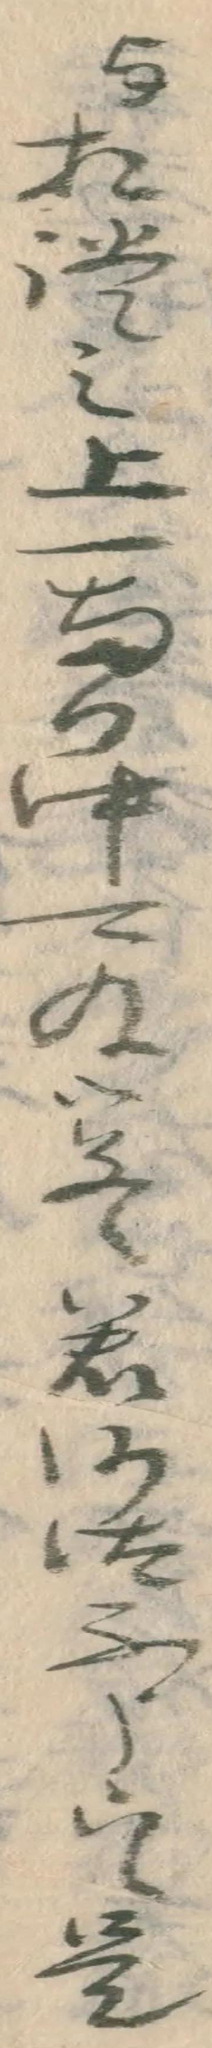与相談之上一両日中可及御答若沙汰不申候ハヽ是
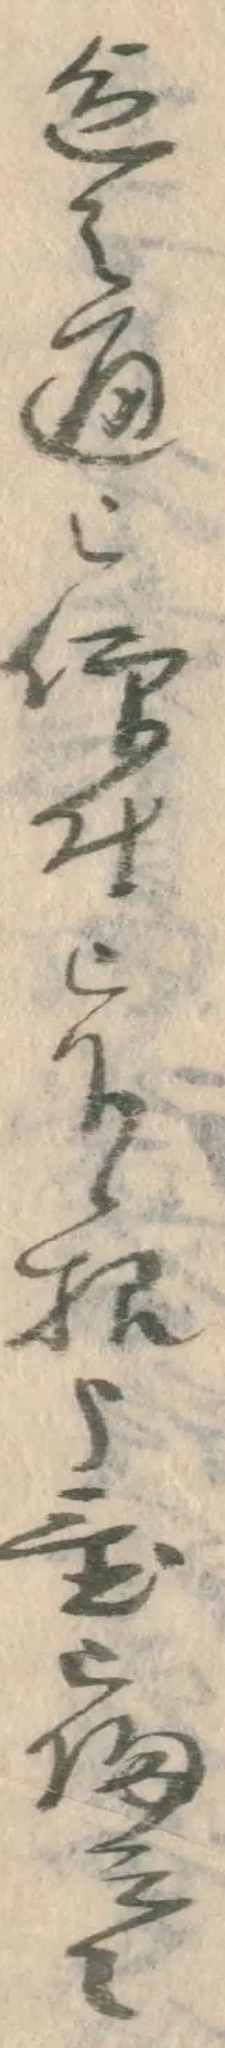迄之通被仰付被下候様申置被帰候
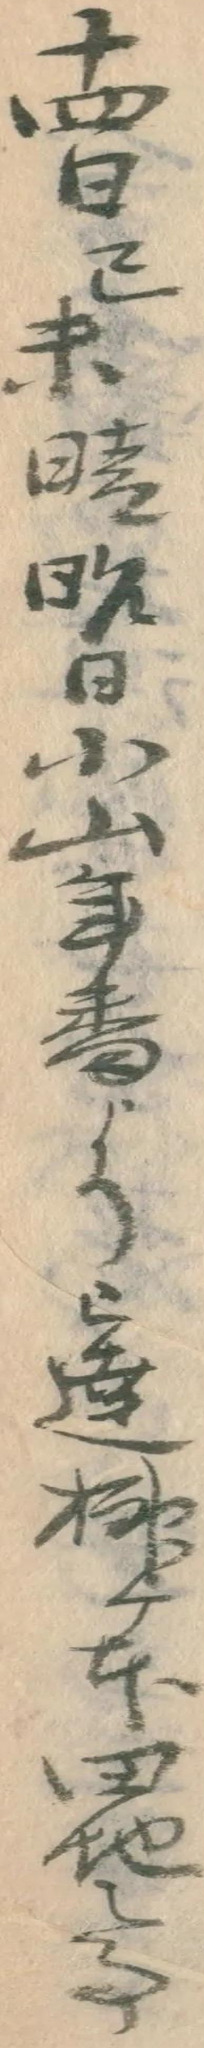十四日己未晴昨日小山年番より被達榊ケ本田地之事

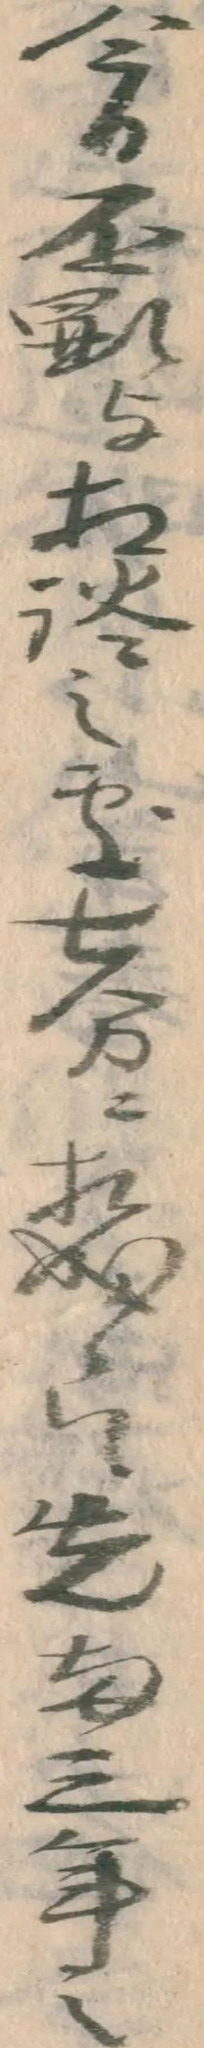今日丕顕与相談之處七分ニ相成候ハヽ先両三年之
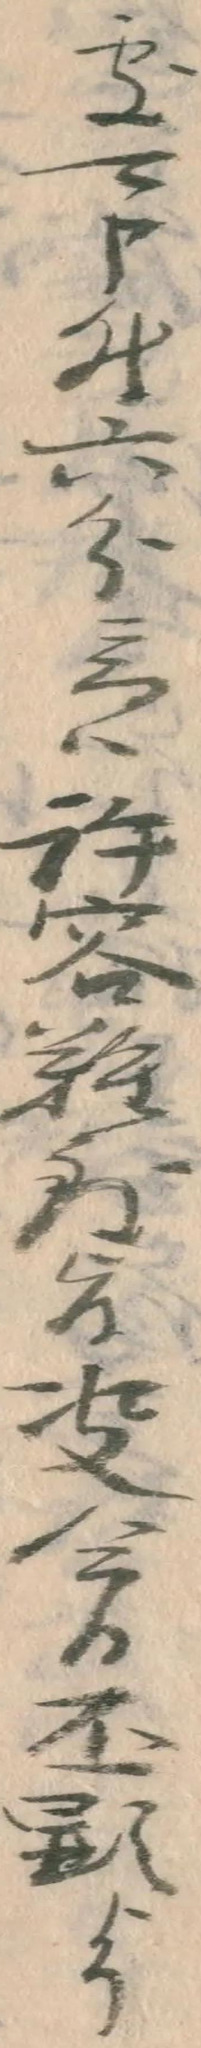處可申付六分ニ而ハ許容難致旨決今日丕顕より
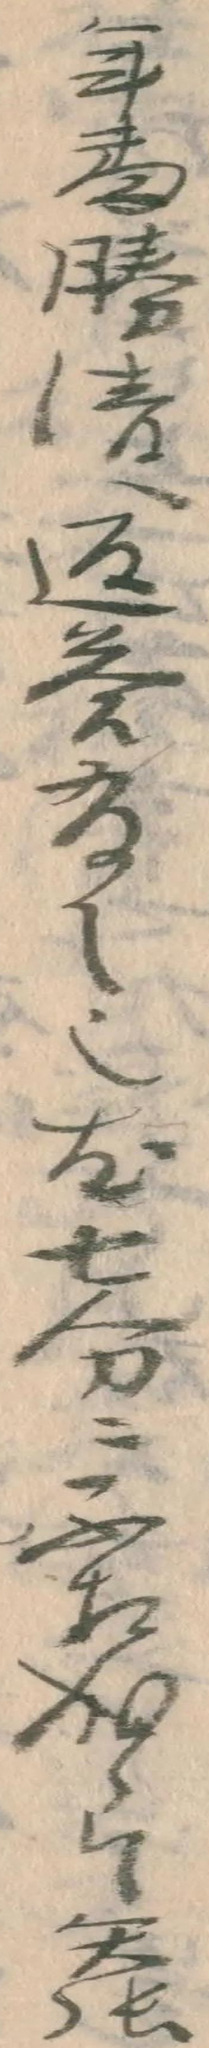年番勝清へ返答有之也尤七分ニ不相成候は矢張
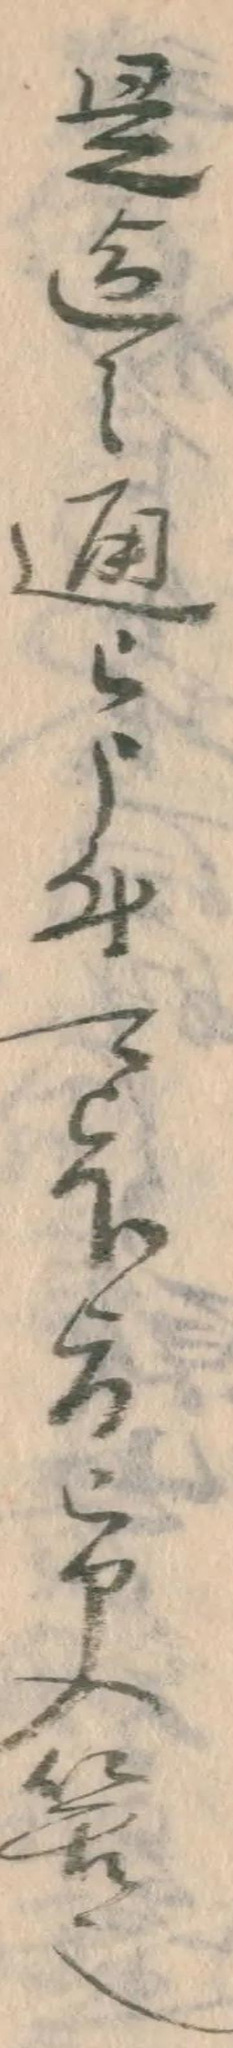是迄之通被申付可被下旨被申入筈業也
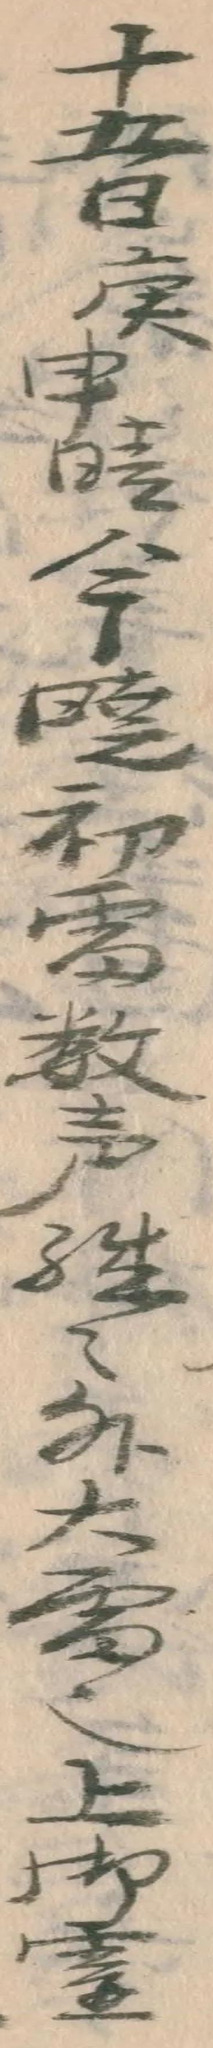十五日庚申晴今暁初雷数声殊之外大雷也上御霊
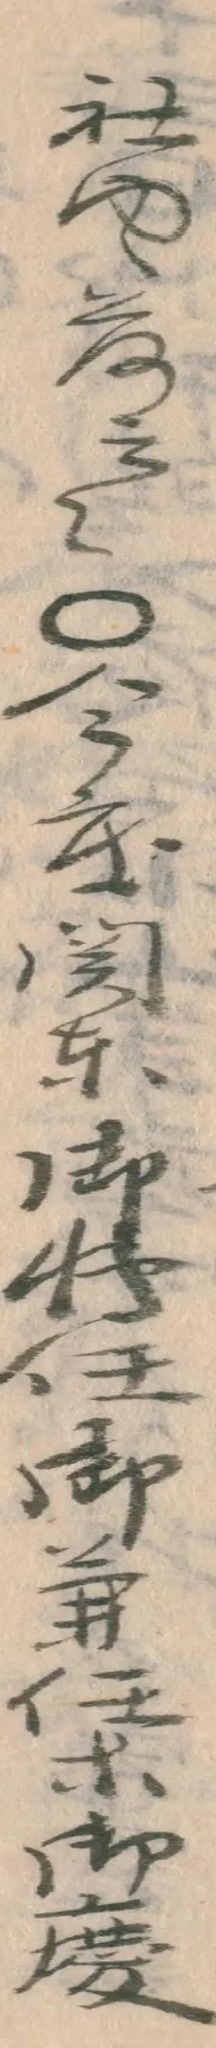社内ヘ落云々○今度関東御轉任御兼任等御慶
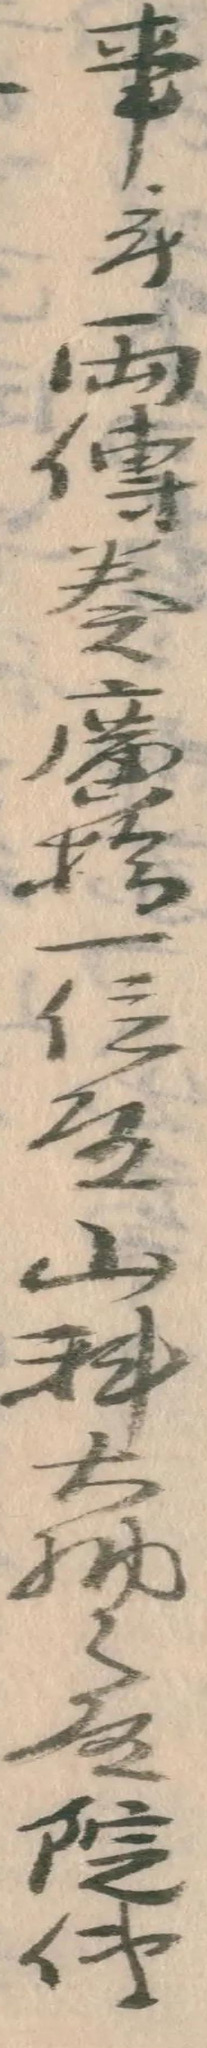事ニ付両傳奏広橋一位殿山科大納言殿院傳
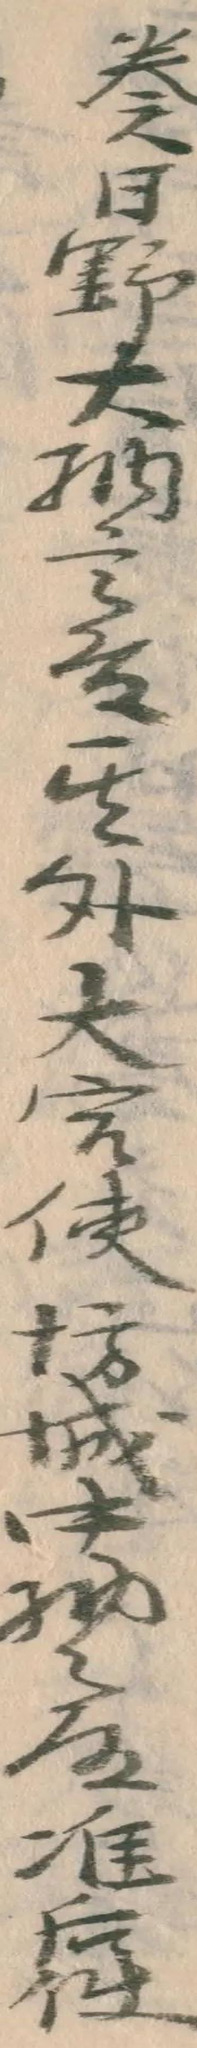奏日野大納言殿其外大宮使坊城中納言殿准后仕
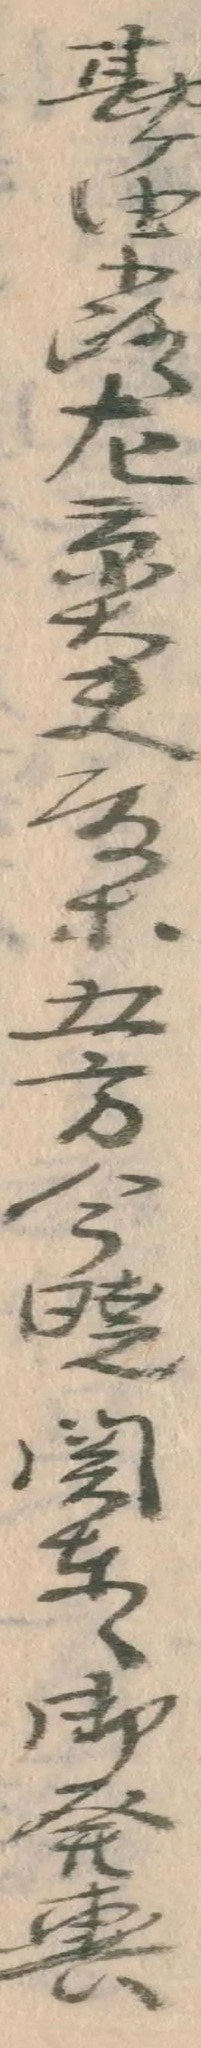勘ヶ由小路左京大夫殿等五方今暁関東へ御発輿
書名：賀茂社記録. 第63冊
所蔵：国立国会図書館 National Diet Library, JAPAN
